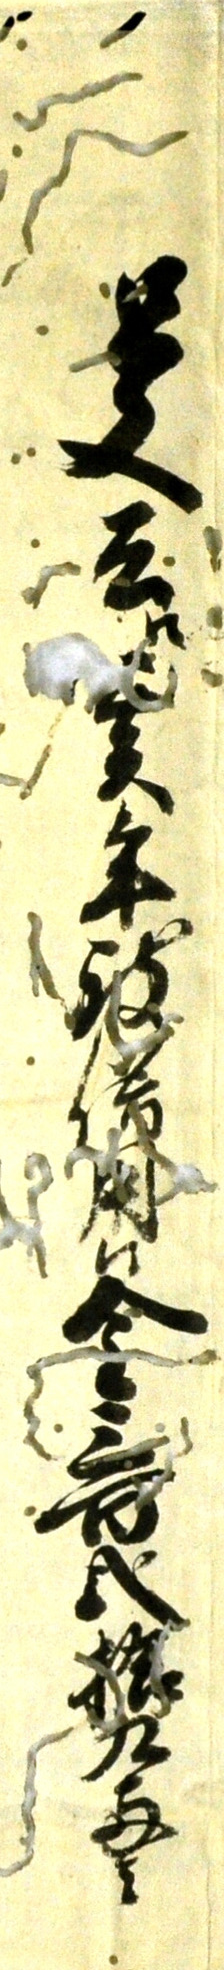是又去ル亥年致借用候金三百弐拾九両は
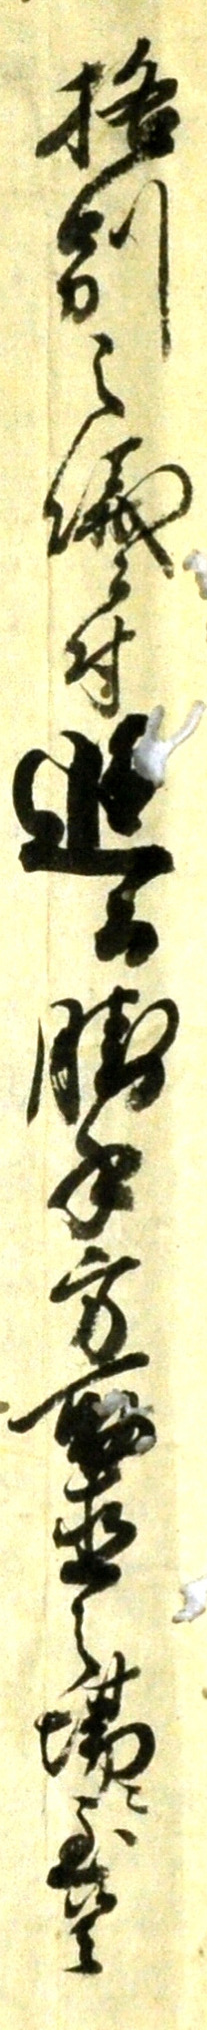格別之儀に付追而勝手方取直之場に至候は
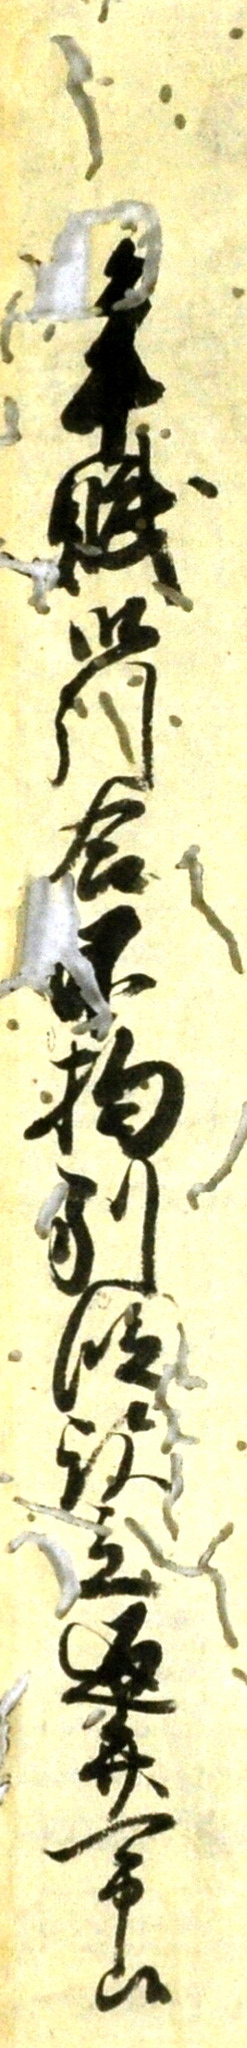年賦御引合不拘別段訳立返弁可申候
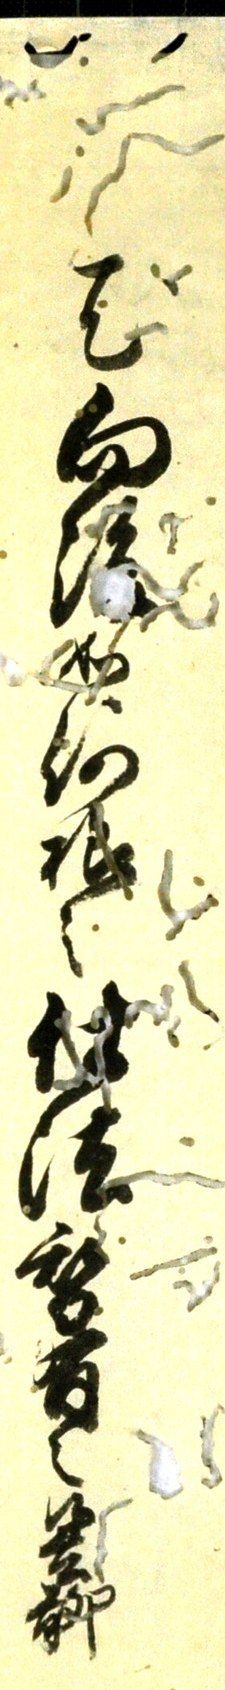尤向後如何様之仕法替有之候共聊
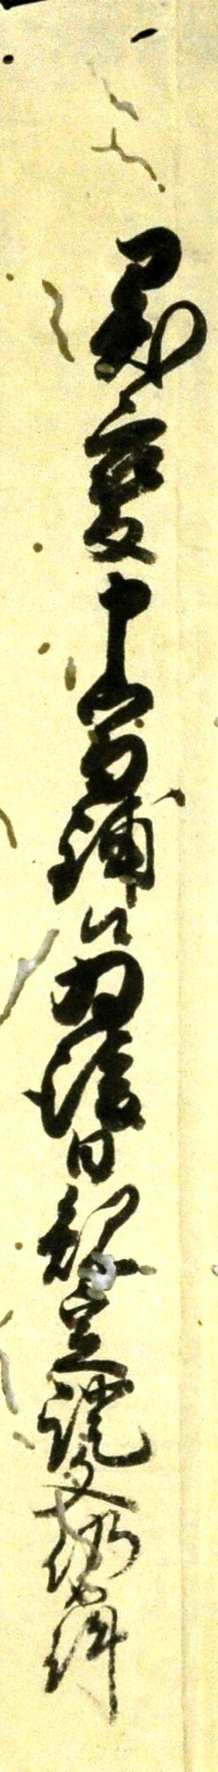異変申間鋪候為後日規定証文仍如件

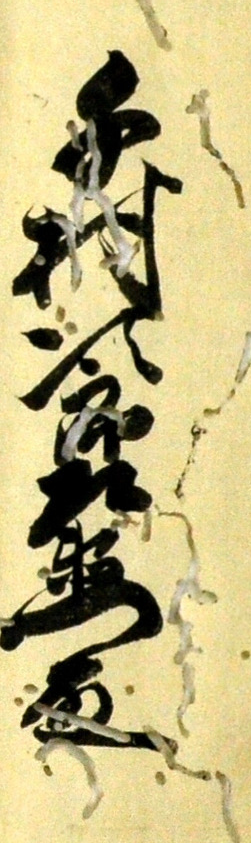千村次郎左衛門殿
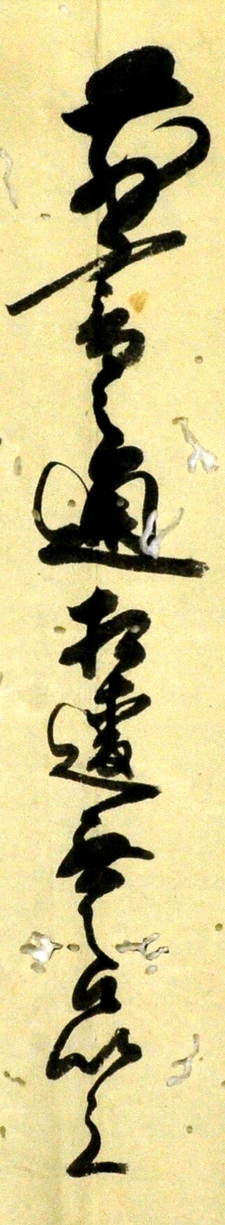前書之通相違無之候以上
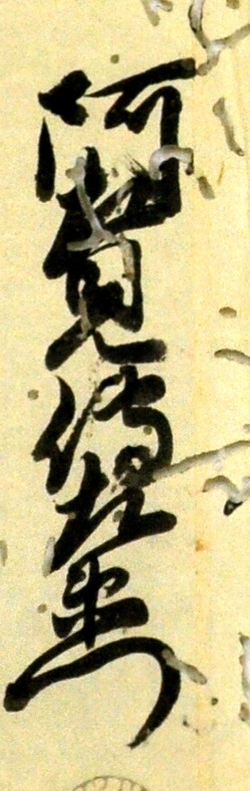阿左見伝左衛門㊞
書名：覚
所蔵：伊那市立高遠町図書館・合同会社AMANE
